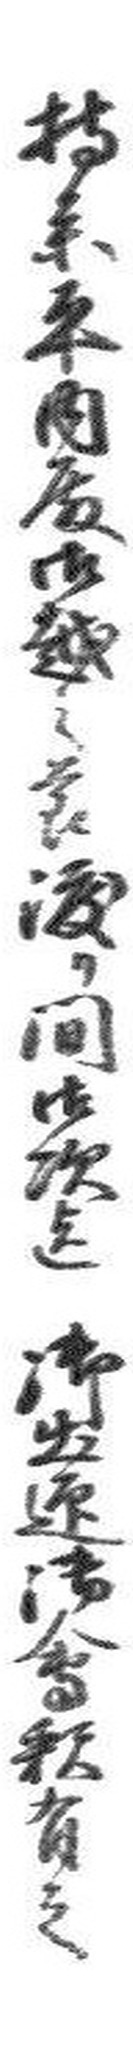持参平岡殿御越之節渡リ間御次迄御出迎御会釈有之
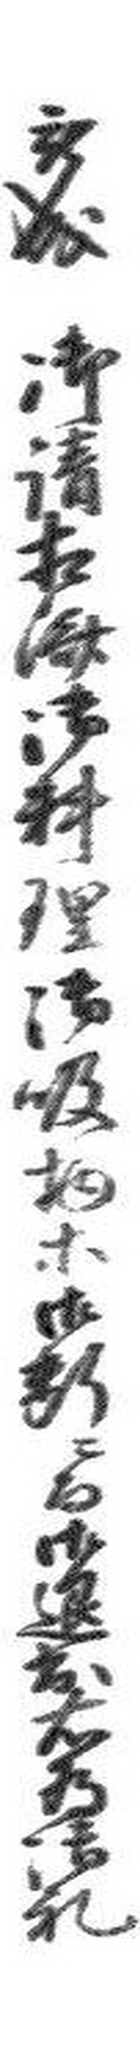被成御請相済御料理御吸物等御断ニ而御退出右為御礼

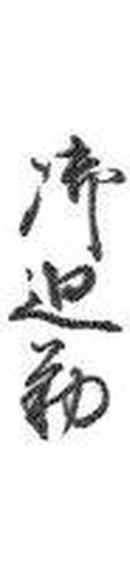御廻勤
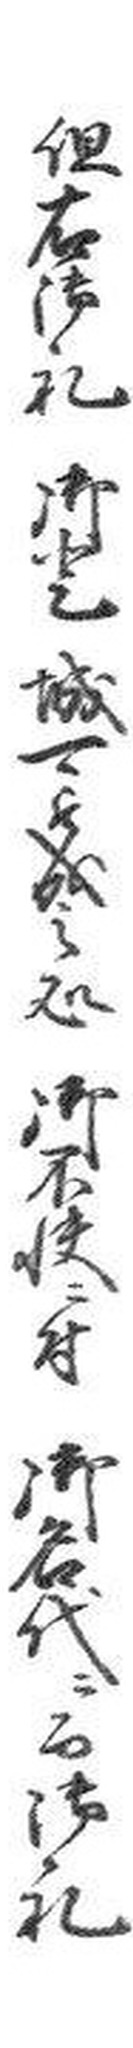但右御礼御登城可被成之処御不快ニ付御名代ニ而御礼
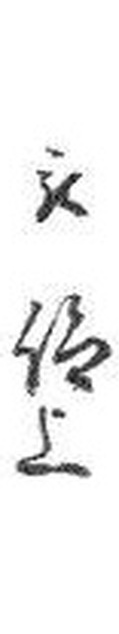被仰上
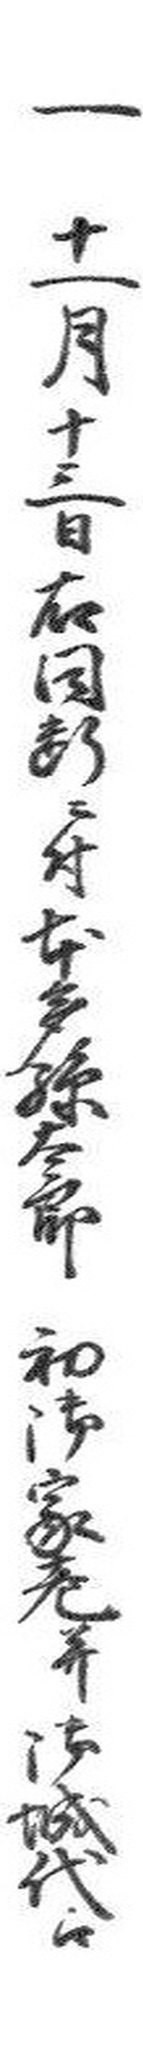一十一月十三日右同断ニ付本多孫太郎初御家老并御城代江
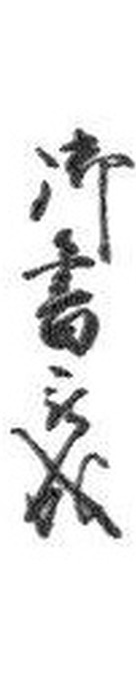御書被成
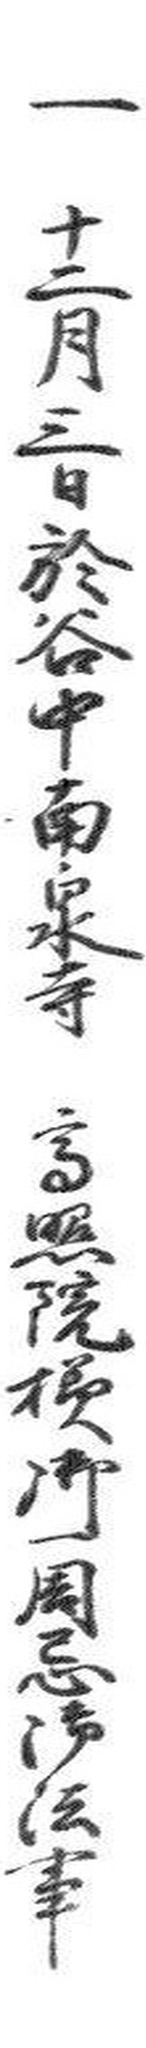一十二月三日於谷中南泉寺高照院様御一周忌御法事
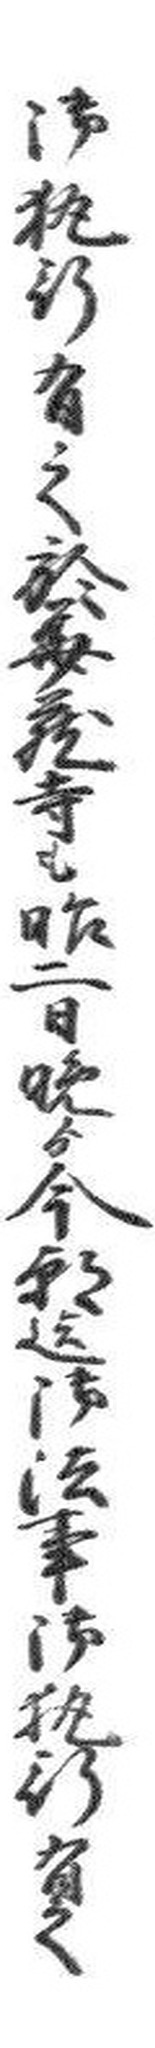御執行有之於華蔵寺も昨二日晩ゟ今朝迄御法事御執行有之
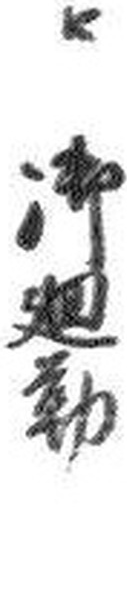御廻勤
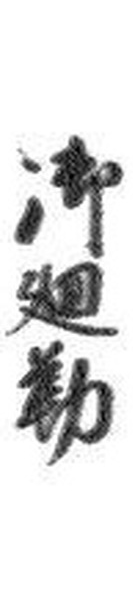御廻勤
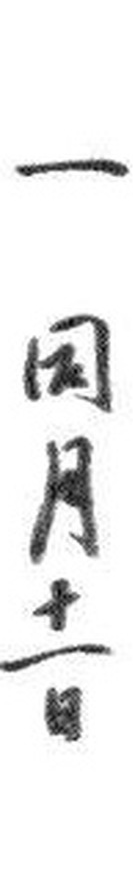一同月十一日
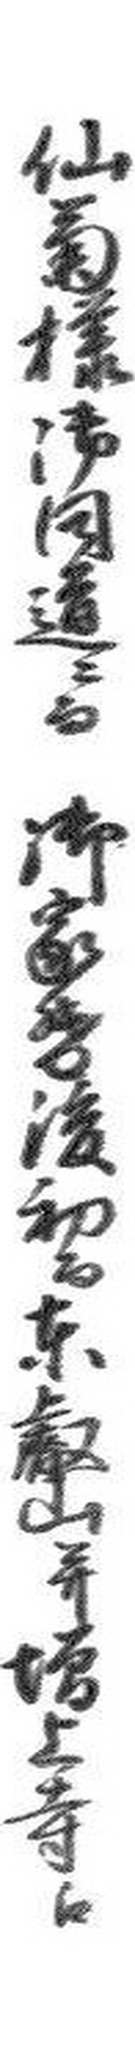仙菊様御同道ニ而御家督後初而東叡山并増上寺江
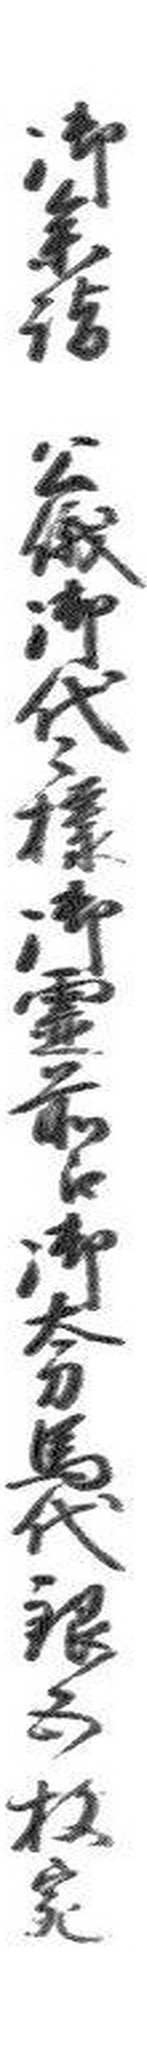御参詣公儀御代々様御霊前江御太刀馬代銀五枚宛
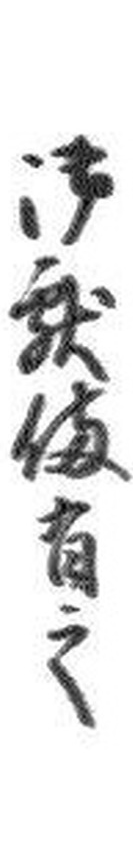御献備有之
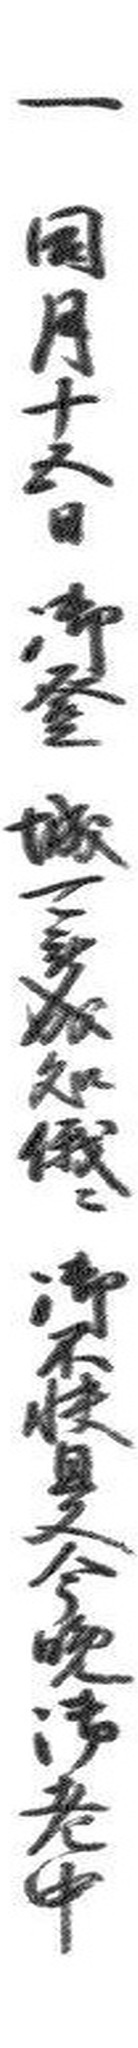一同月十五日御登城可被成処俄ニ御不快且又今晩御老中
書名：家譜 十一 昌親公 従延宝二年到延宝四年八月
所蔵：福井県文書館 Fukui Prefectural Archives
